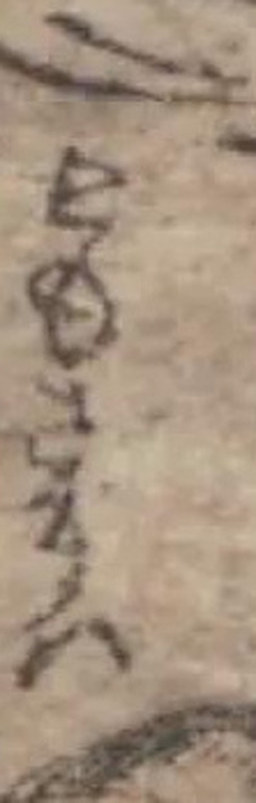ともさまハ
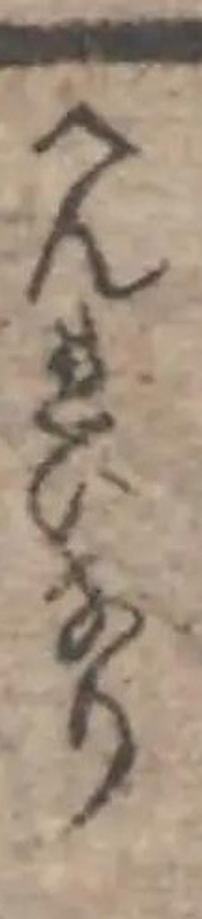へんれいなり
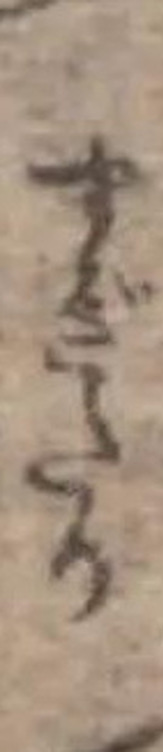すぎたか
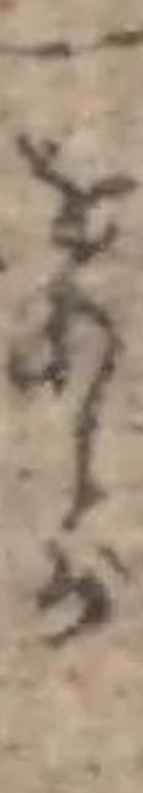をあしが
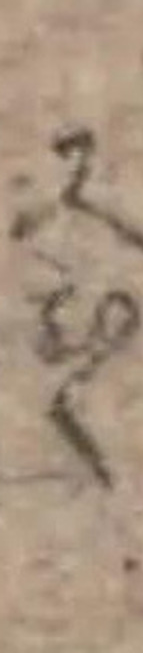又ひく
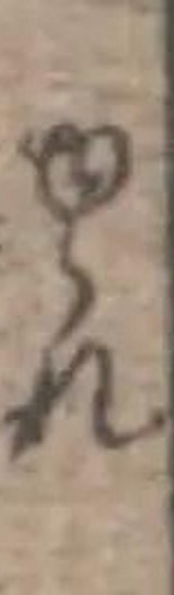ゆられ
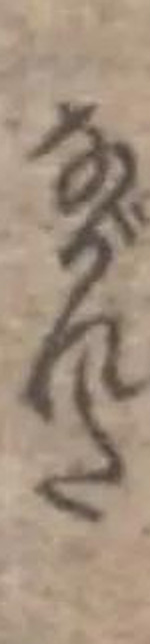ながれた
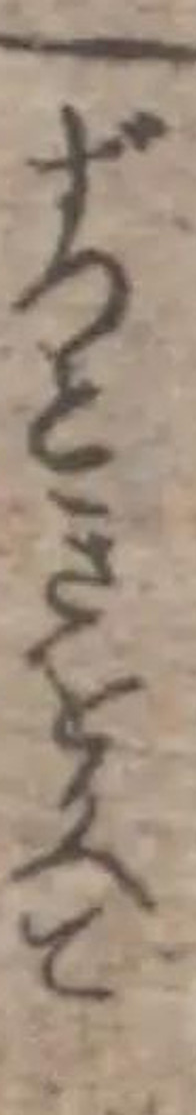ずつときをかへて
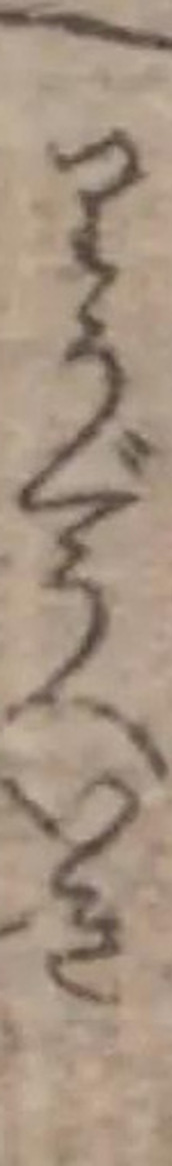りうぐうへいき
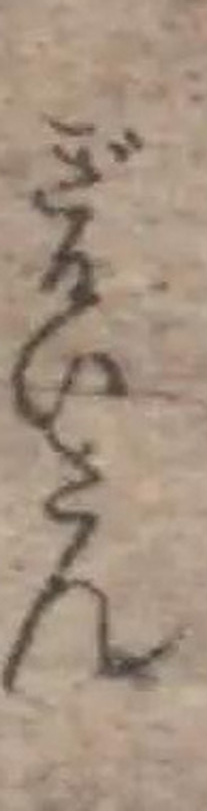ぎけいさん
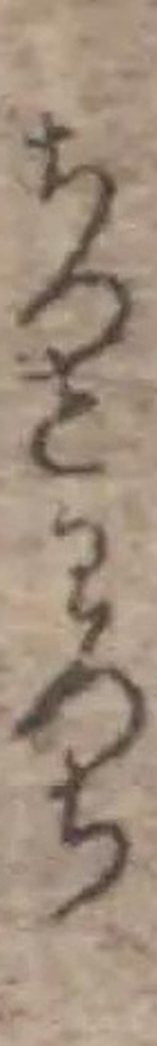ちつとわつち
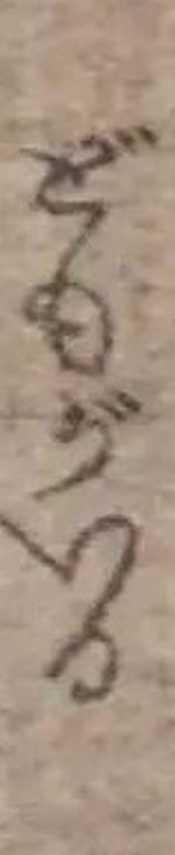どもがいる
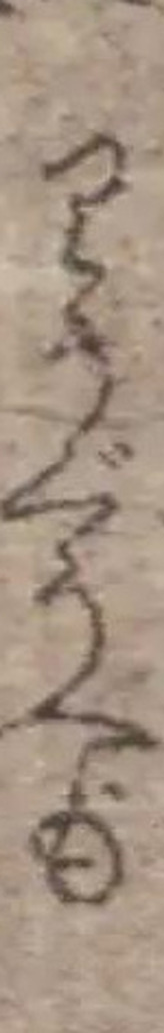りうぐうへも
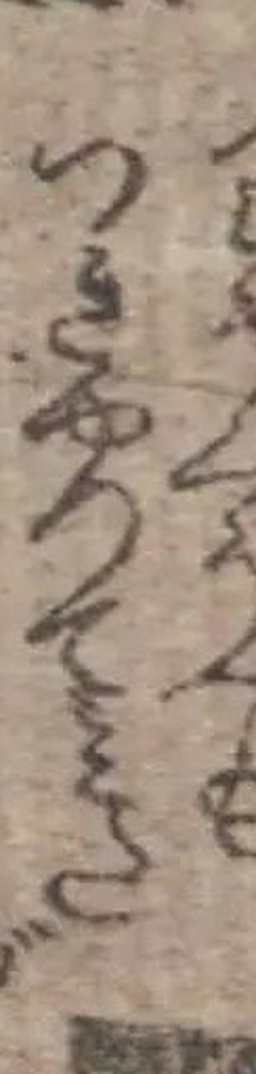つきやつてミたが
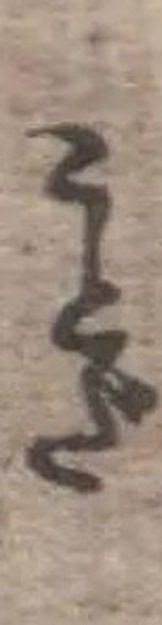ことだ

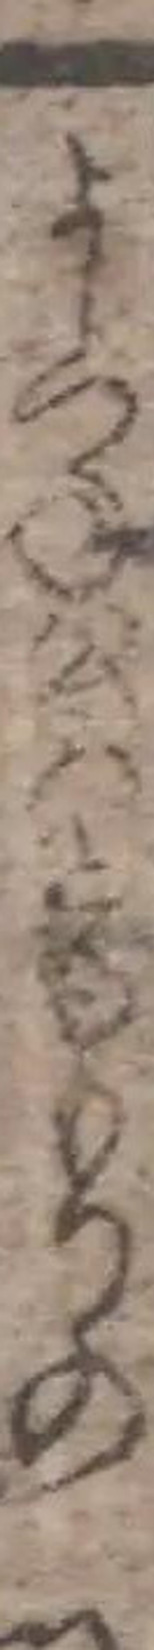よしつね公はとももりの
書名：草紙の曙 3巻
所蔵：国立国会図書館 National Diet Library, JAPAN
